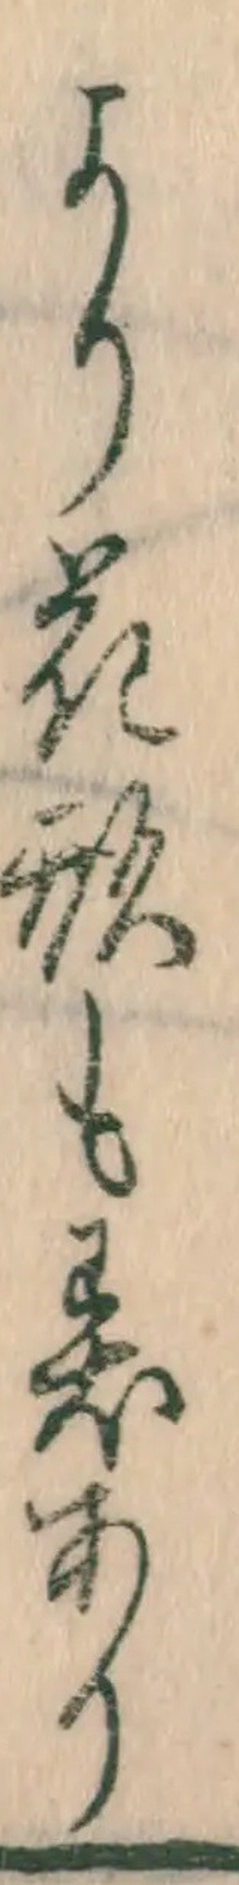より花形も異あり
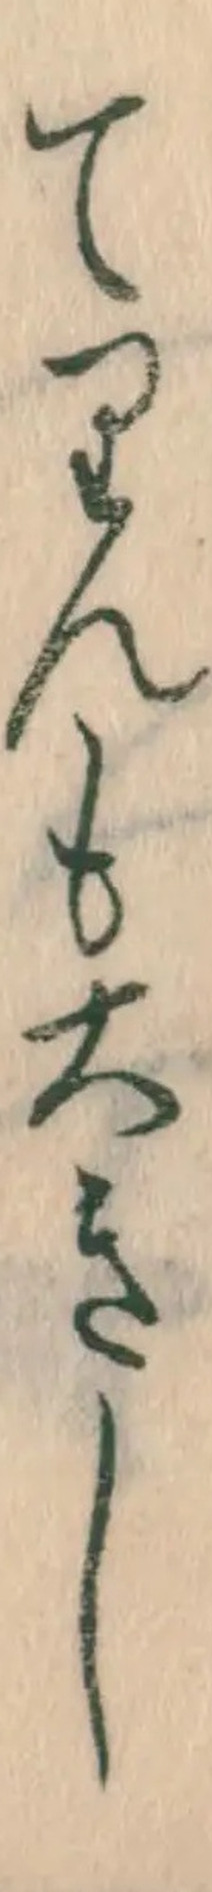てりんも大きし
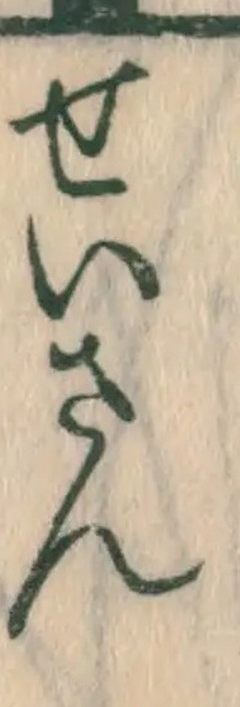せいさん
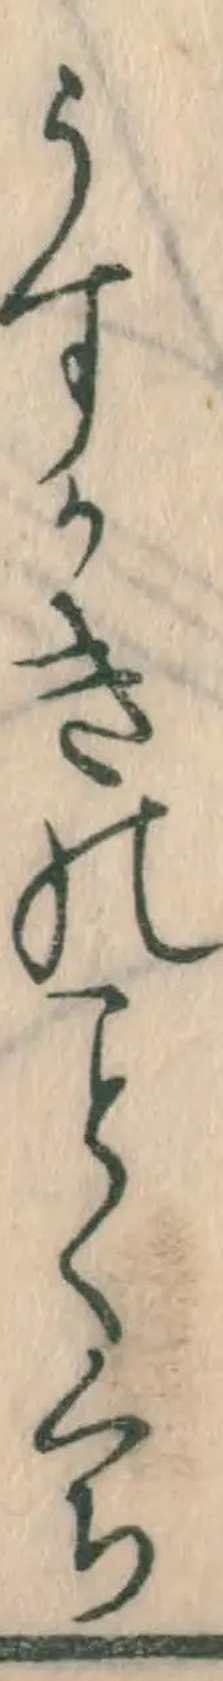うすかきのことくくち
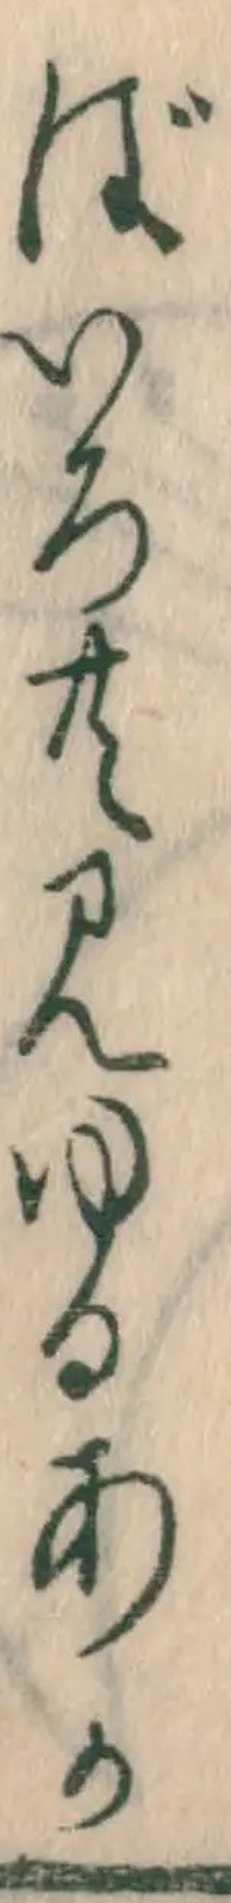ばいろ共見ゆるあか
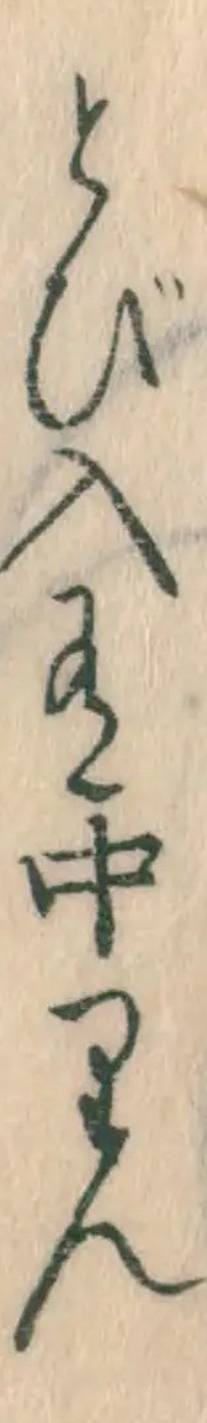とび入有中りん

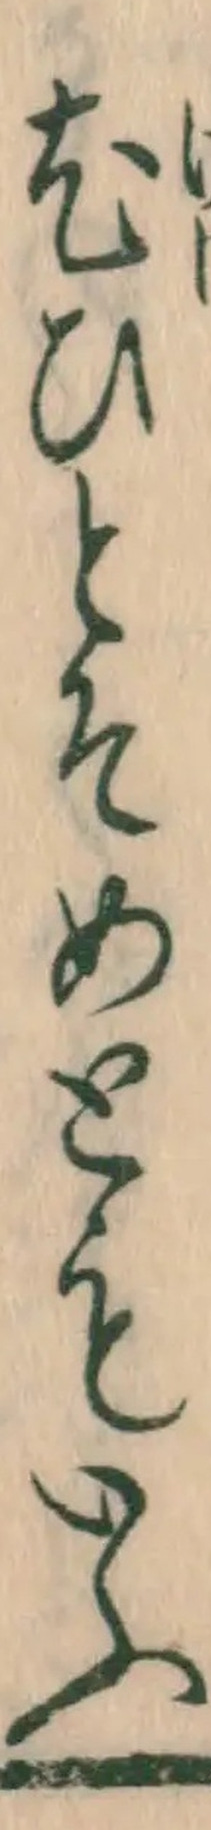尤ひとそめともいふ
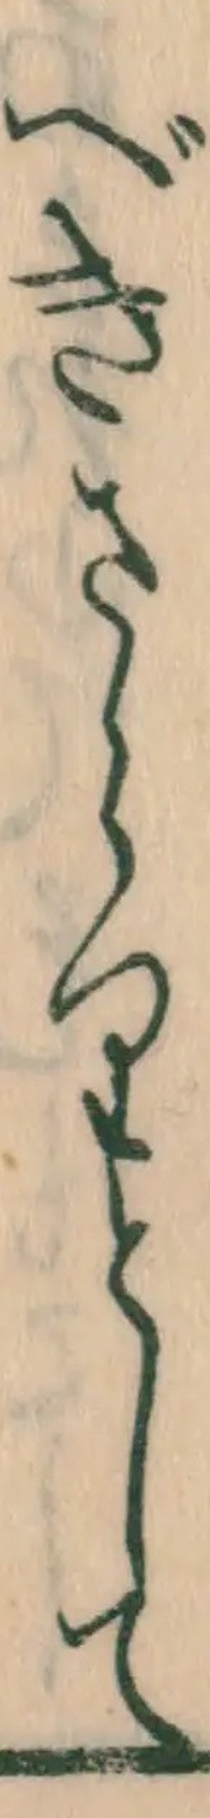べきさらりとして
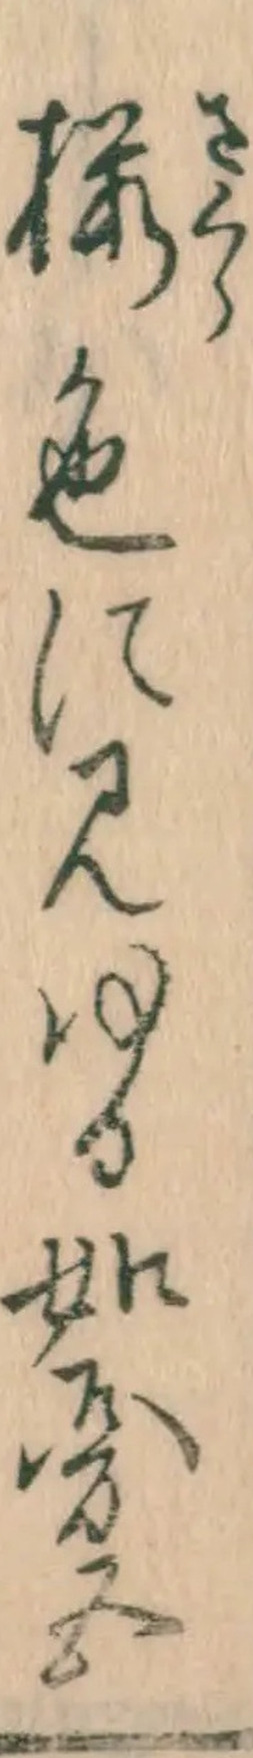桜色に見ゆる如図五
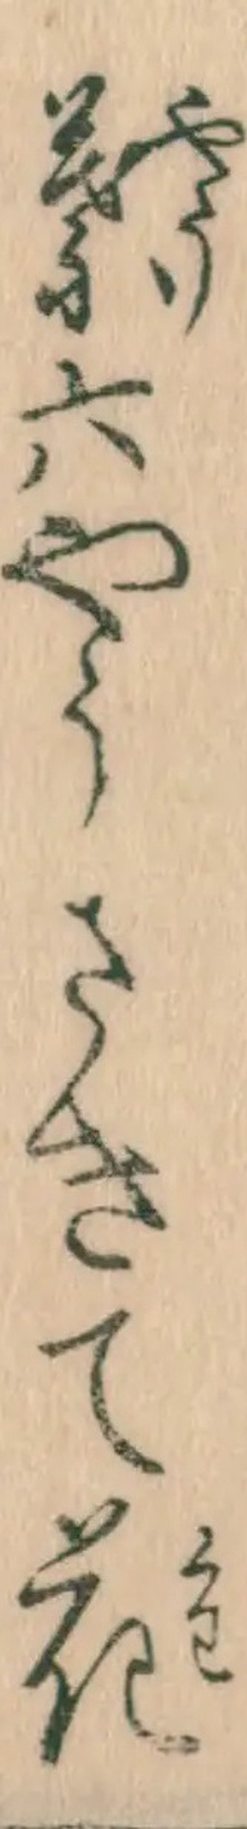葉六やうさきて花
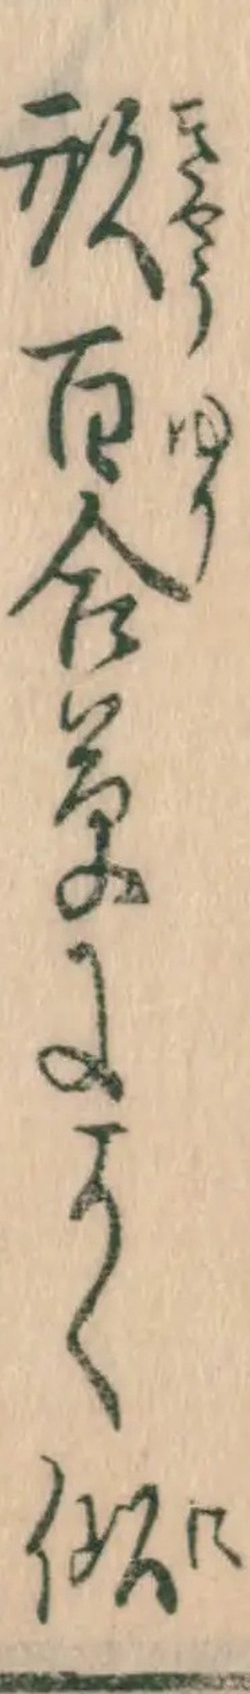形百合草によく似
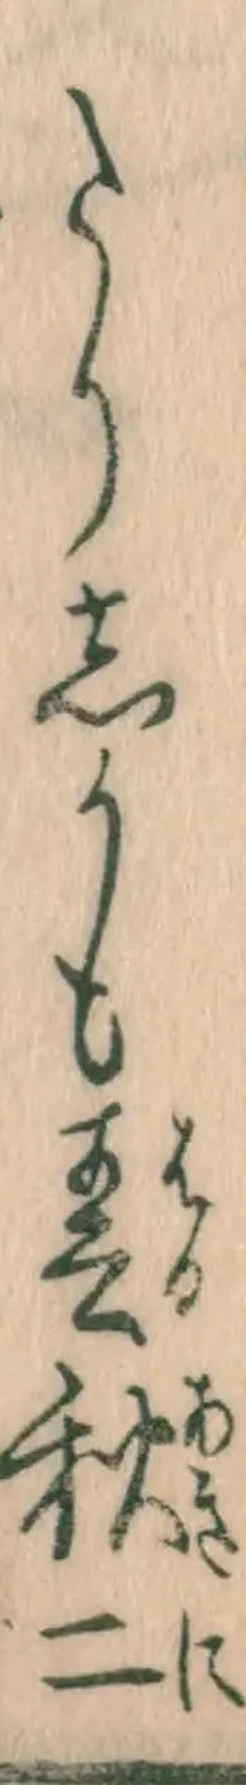たりしかも春秋二
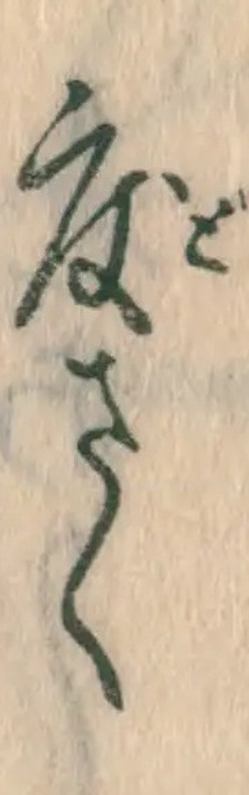度さく
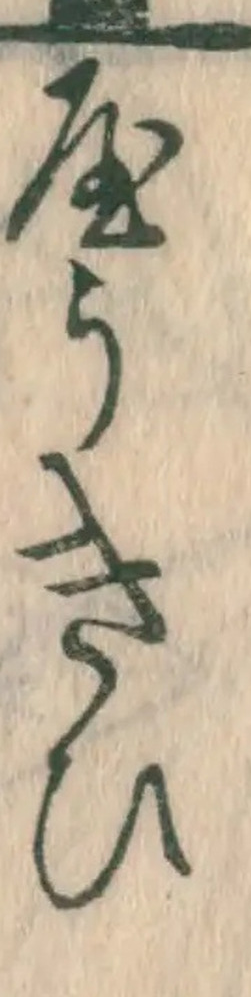やうきひ
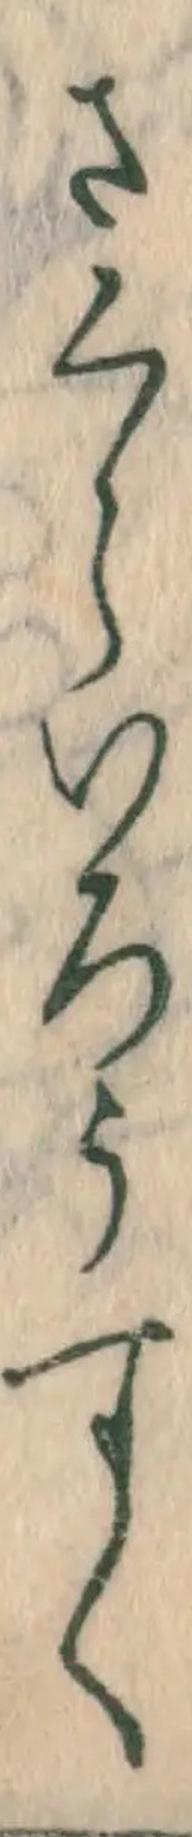さくらいろうすく
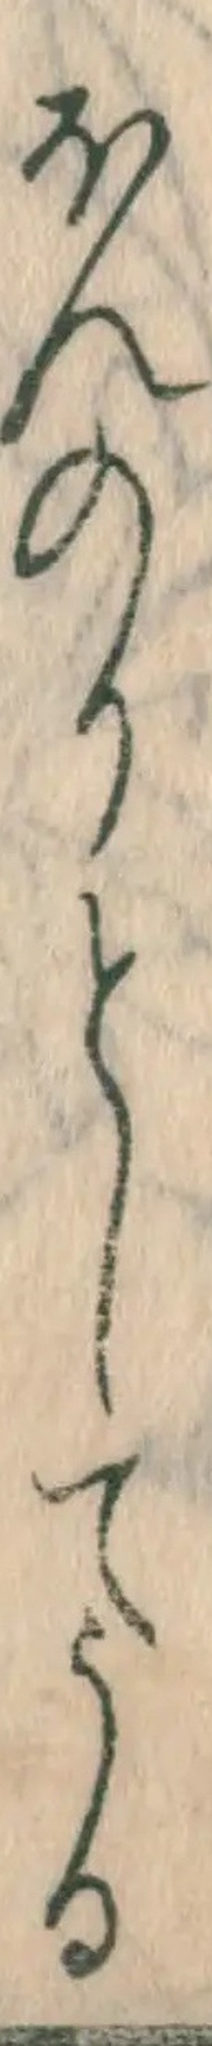ほんのりとしてうる
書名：錦繍枕 5巻. [1]
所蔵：国立国会図書館 National Diet Library, JAPAN
